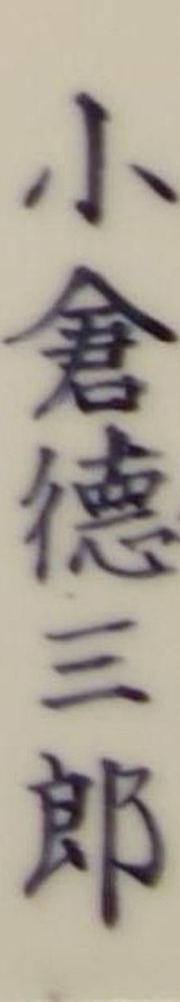小倉徳三郎
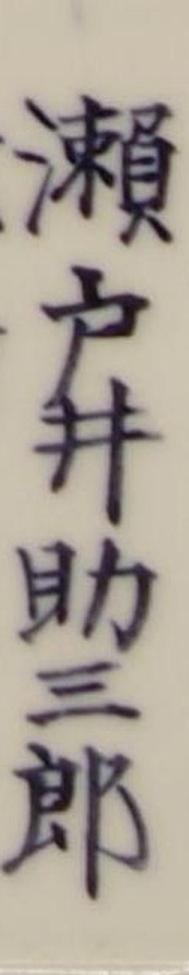瀬戸井助三郎
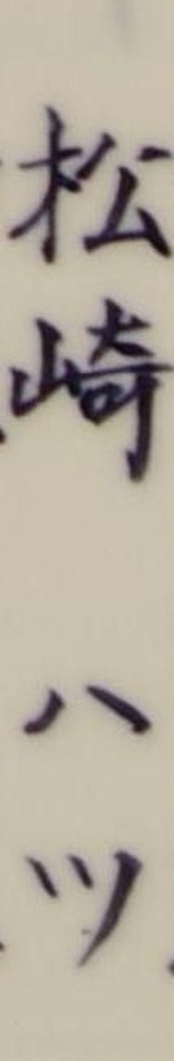松崎ハツ
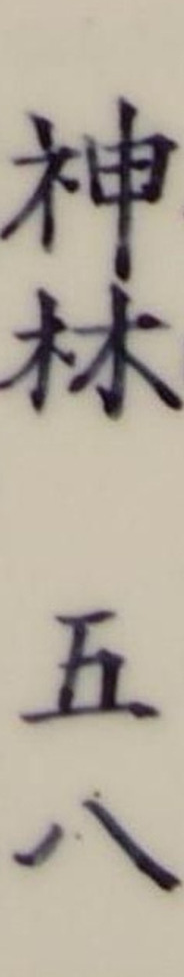神林五八
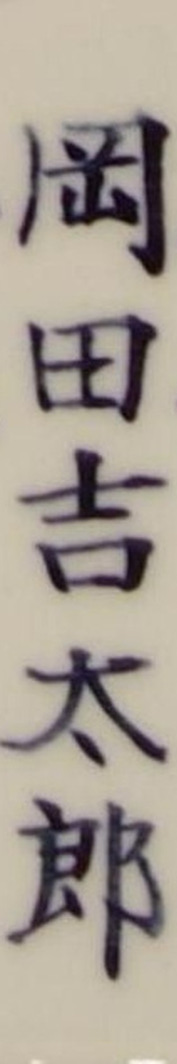岡田吉太郎
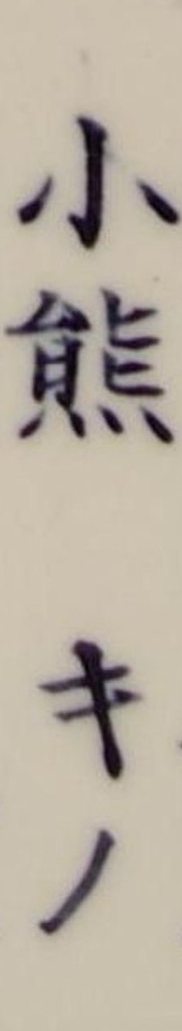小熊キノ
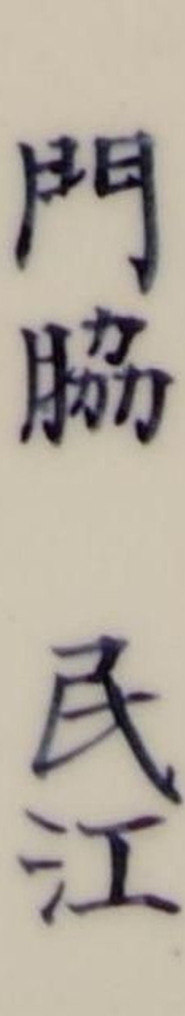門脇民江
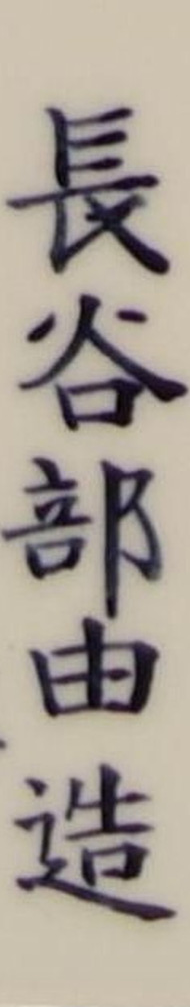長谷部由造
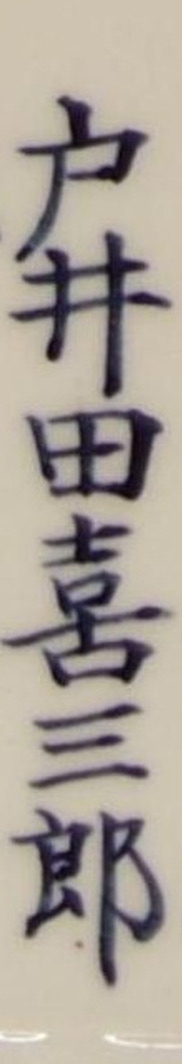戸井田喜三郎
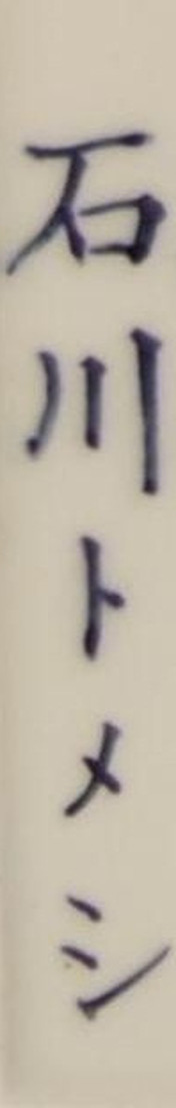石川トメシ

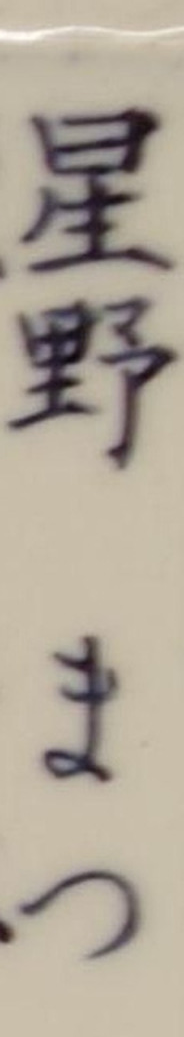星野まつ
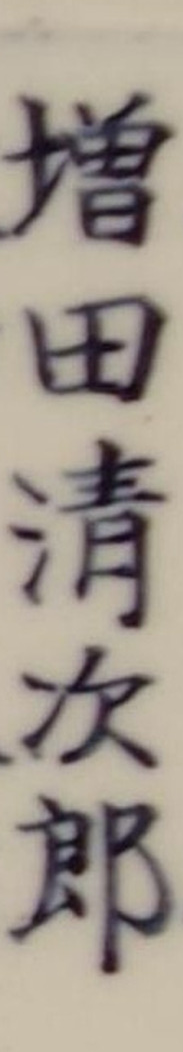増田清次郎
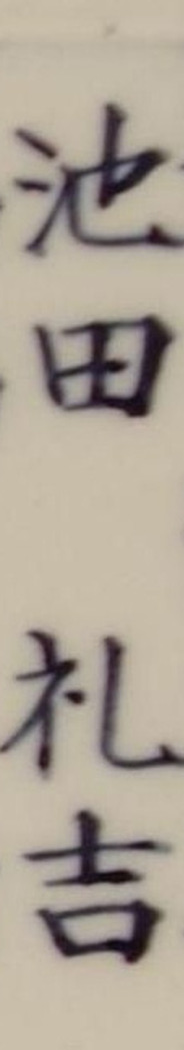池田札吉
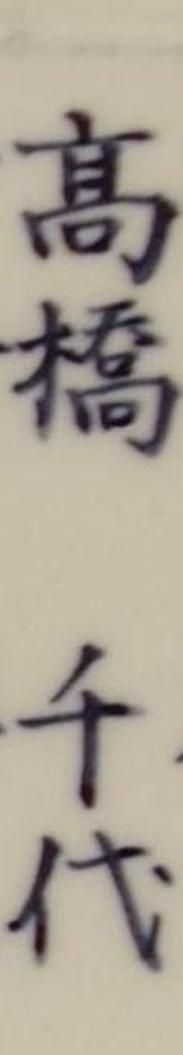高橋千代
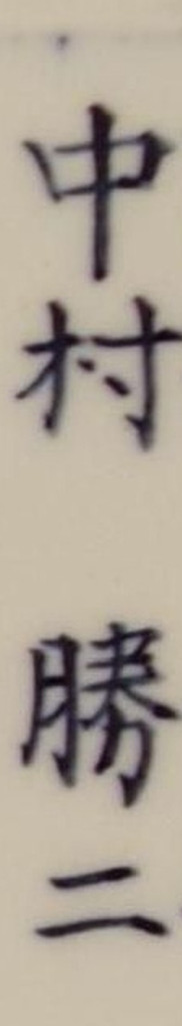中村勝二
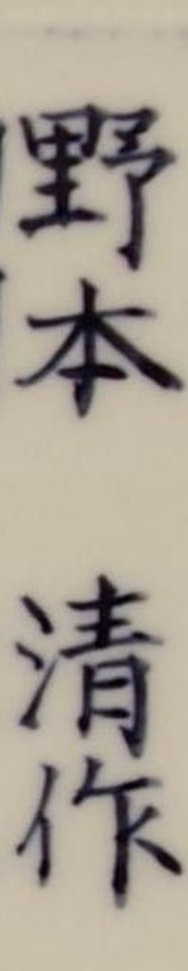野本清作
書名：E~L
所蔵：高野山金剛峯寺
